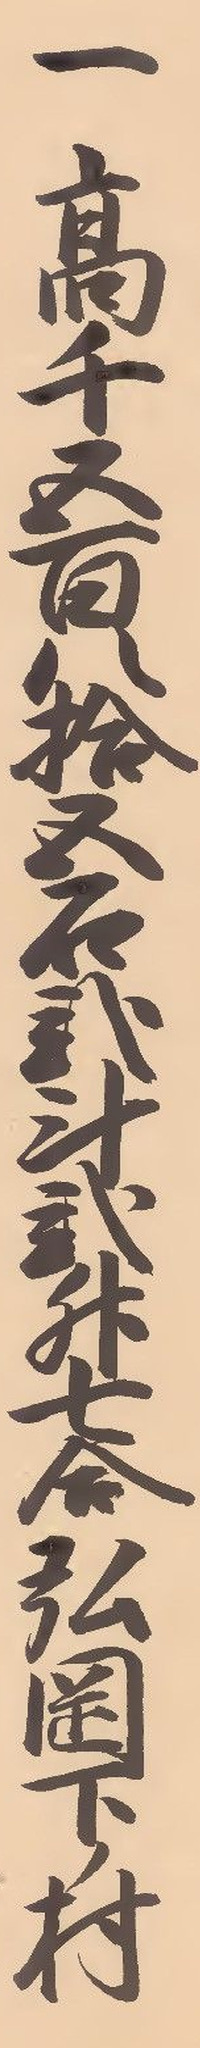一髙千五百八拾五石弐斗弐升七合弘岡下ノ村
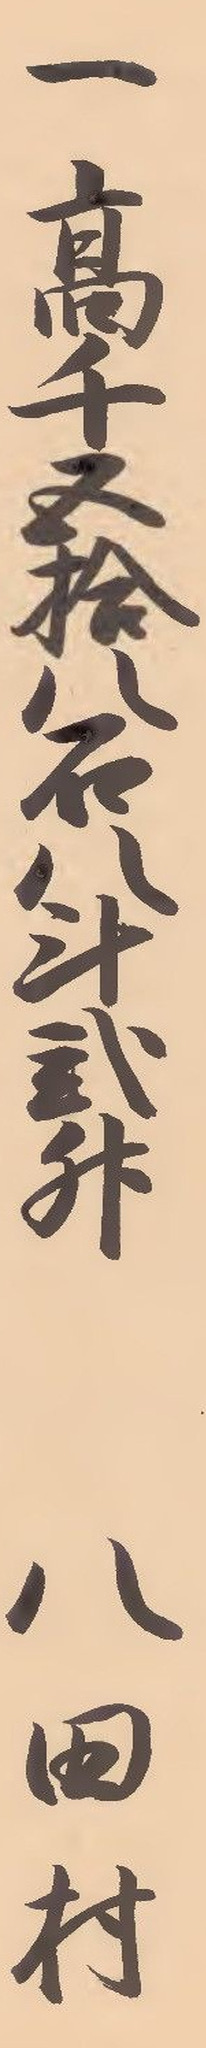一髙千五拾八石八斗弐升八田村
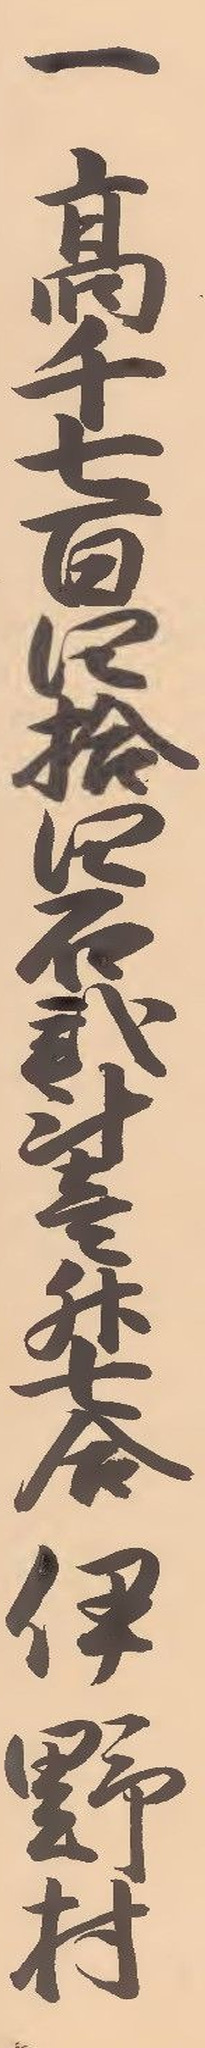一髙千七百四拾四石弐斗壱升七合伊野村
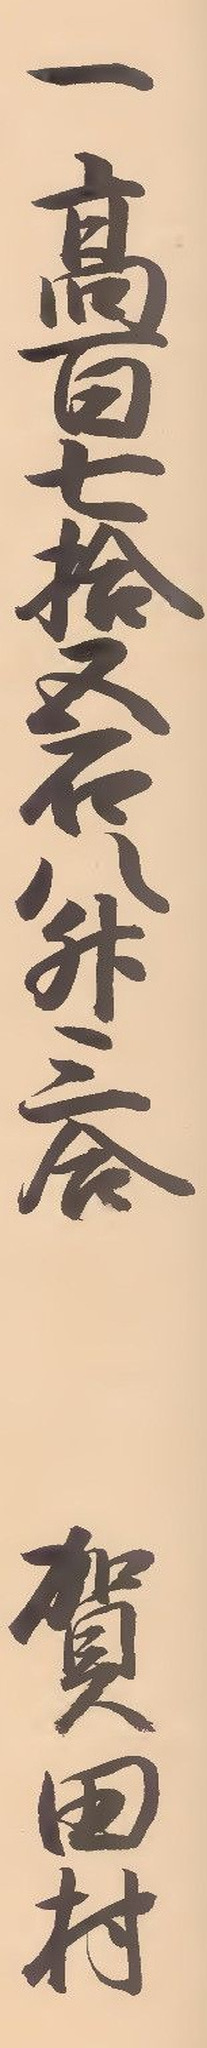一髙百七拾五石八升三合賀田村
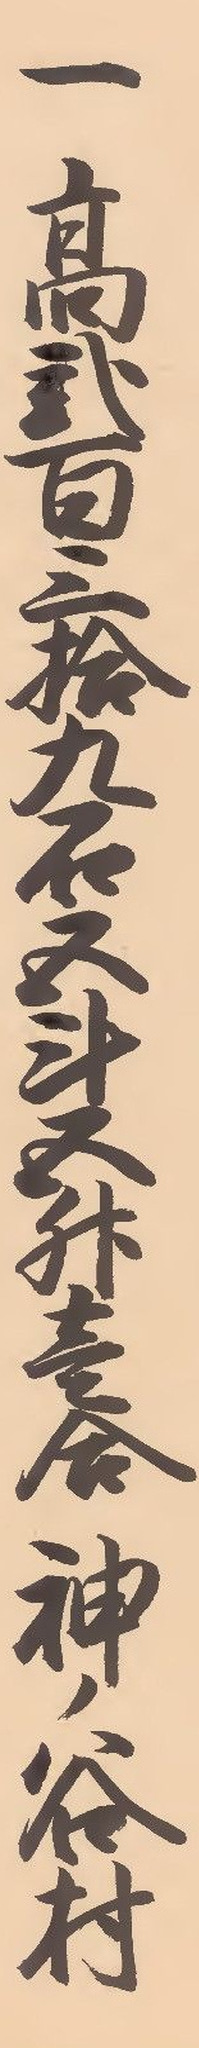一髙弐百三拾九石五斗五升壱合神ノ谷村
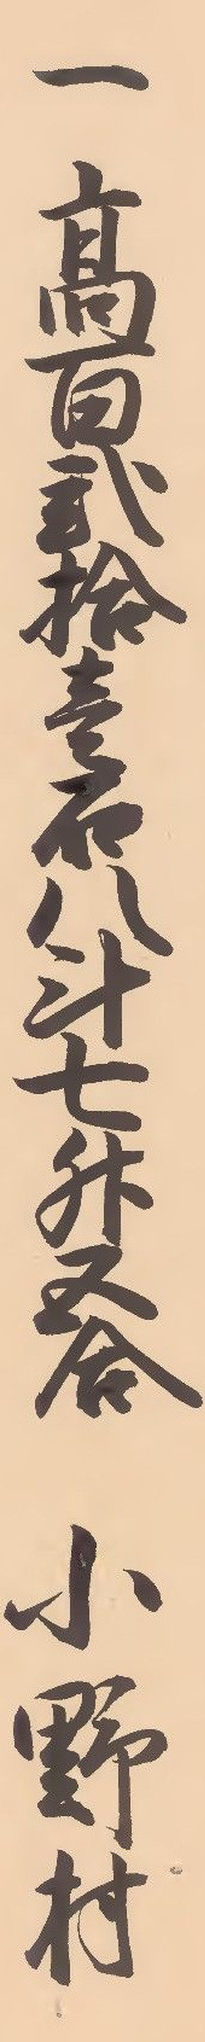一髙百弐拾壱石八斗七升五合小野村
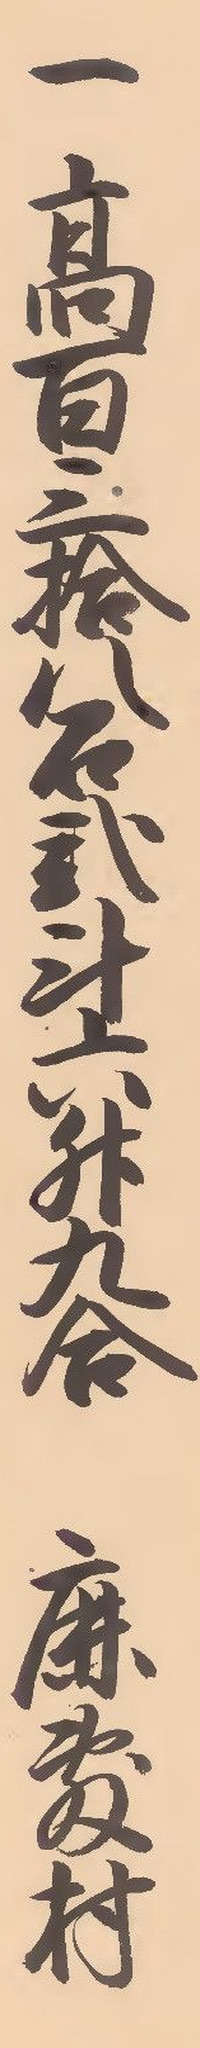一髙百三拾八石弐斗六升九合鹿敷村

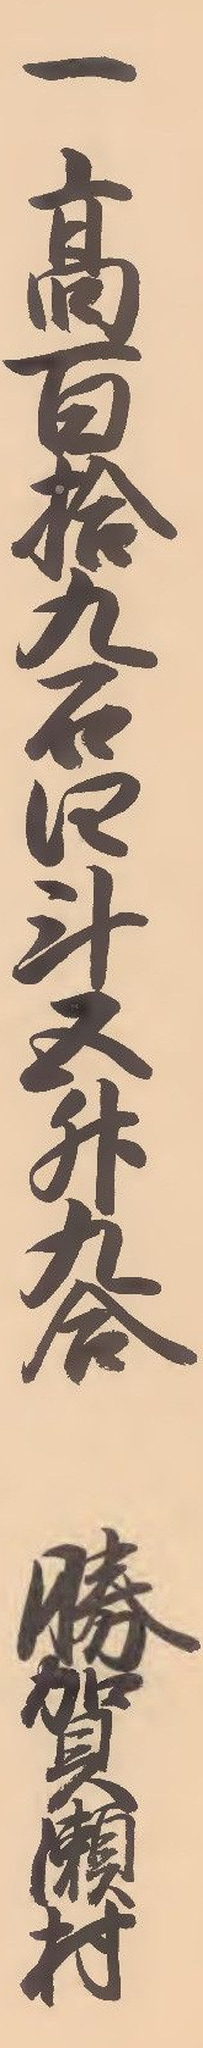一髙百拾九石四斗五升九合勝賀瀬村
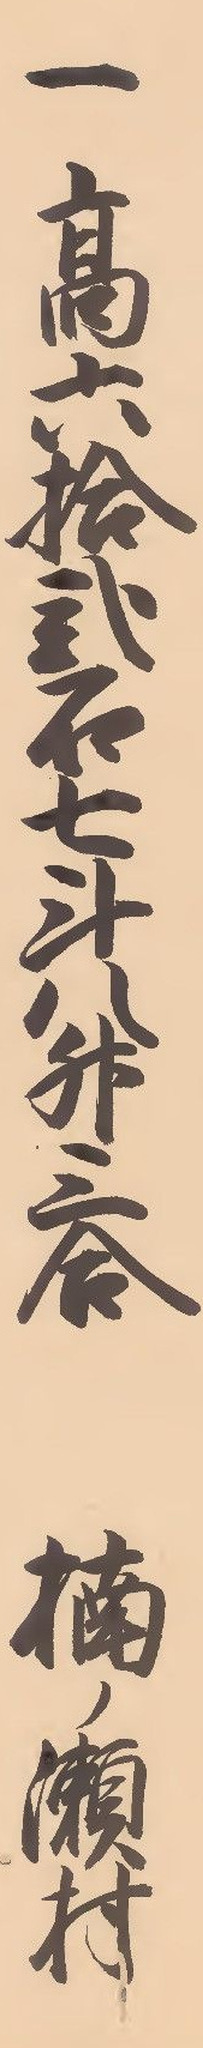一髙六拾弐石七斗八升三合楠ノ瀬村
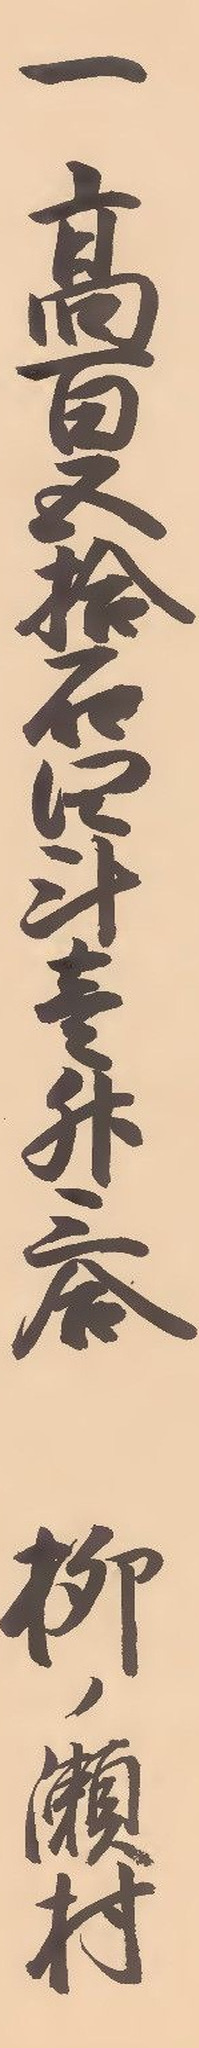一髙百五拾石四斗壱升三合柳ノ瀬村
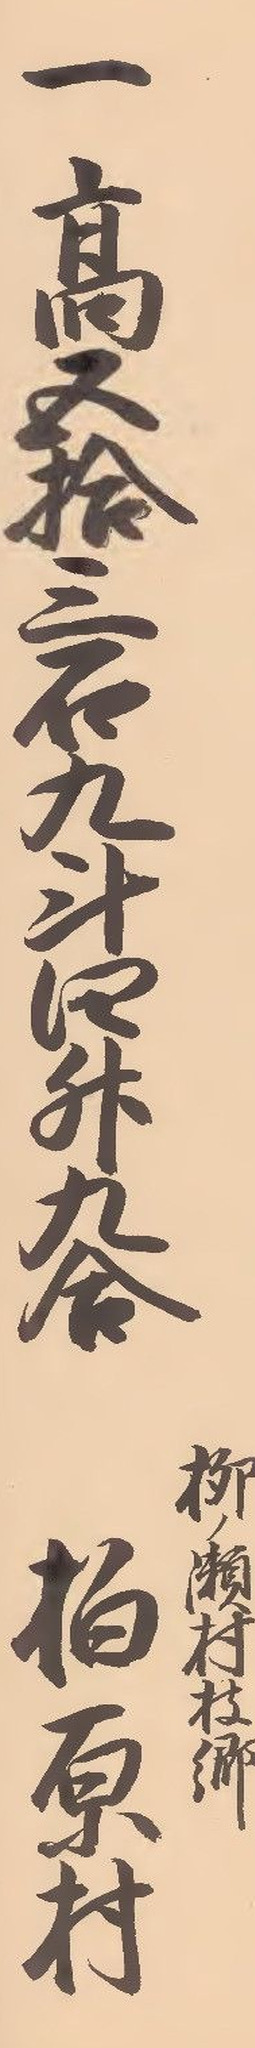一髙五拾三石九斗四升九合柏原村
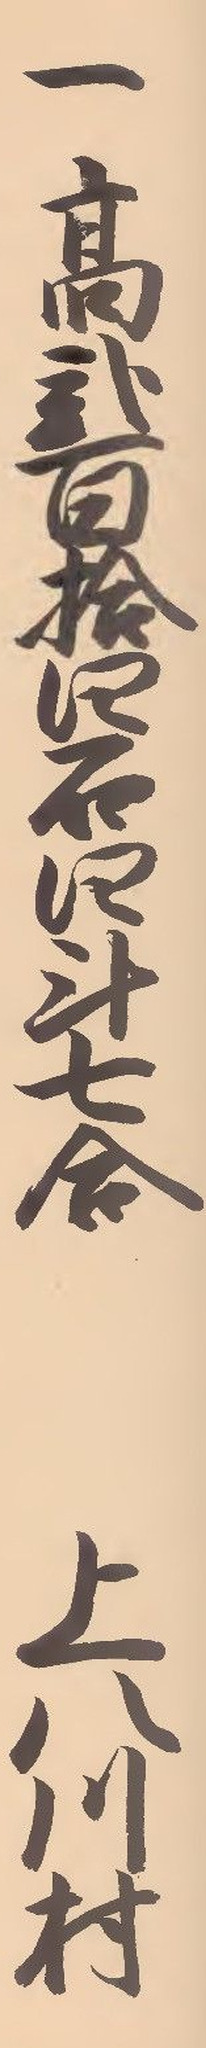一髙弐百拾四石四斗七合上八川村
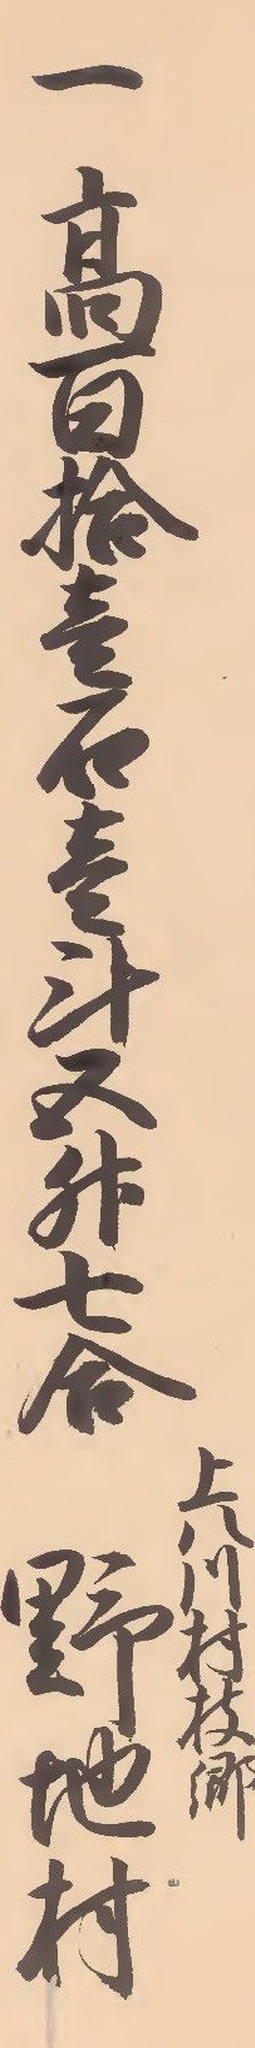一髙百拾壱石壱斗五升七合野地村
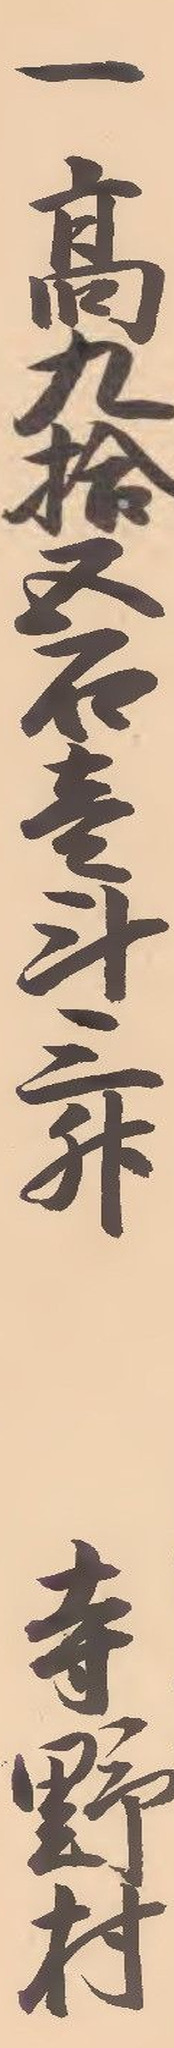一髙九拾五石壱斗三升寺野村

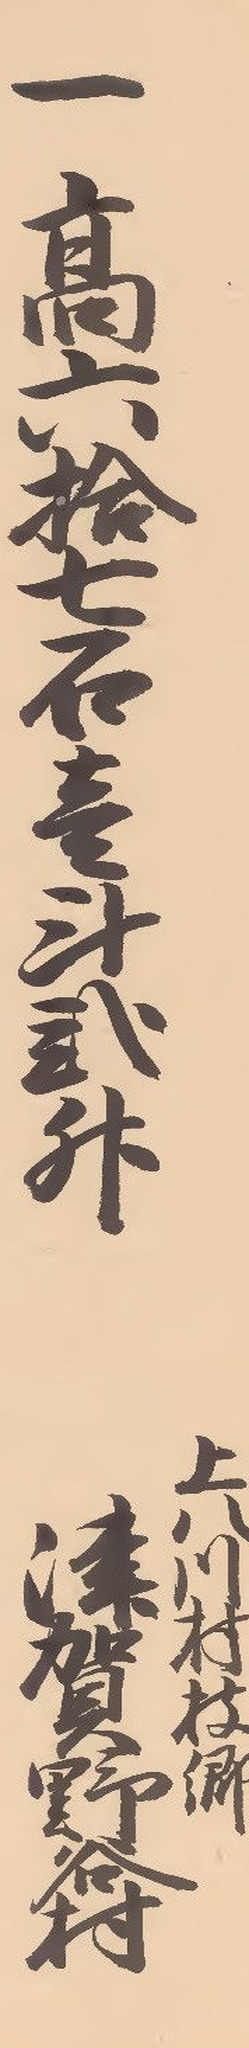一髙六拾七石壱斗弐升津賀野谷村
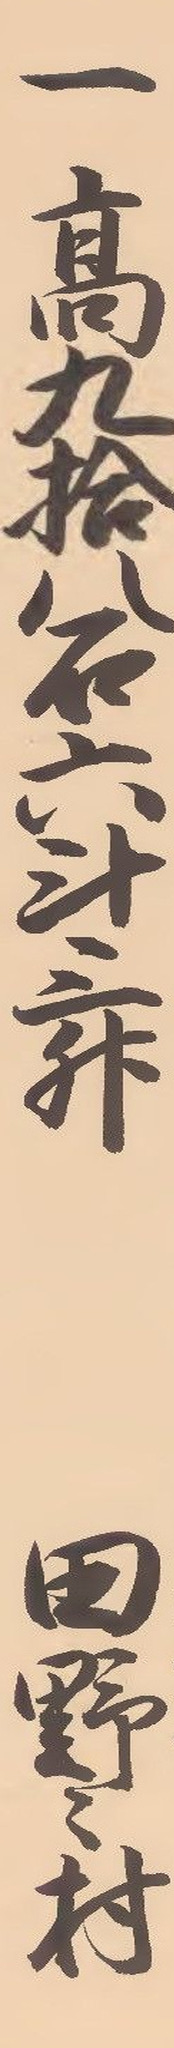一髙九拾八石六斗三升田野々村
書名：土佐国郷帳
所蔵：国立公文書館 National Archives of Japan
